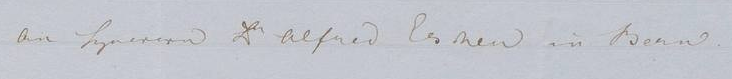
An Herrn Dr Alfred Escher in Bern.
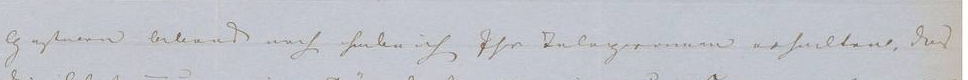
Gestern Abend noch habe ich Ihr Telegramm erhalten, das
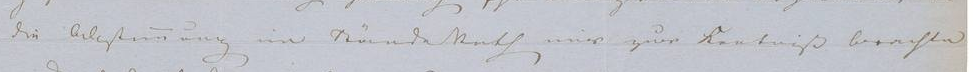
die Abstimmung im StändeRath mir zur Kentniß brachte
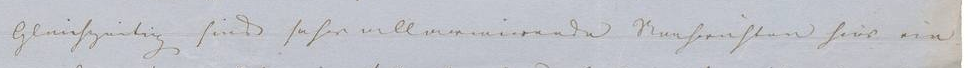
Gleichzeitig sind sehr allarmirende Nachrichten hier ein-
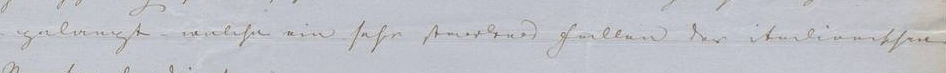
gelangt – welche ein sehr starkes Fallen der italienischen
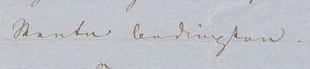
Rente bedingten.
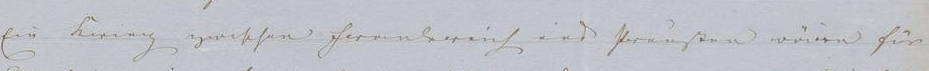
Ein Krieg zwischen Frankreich und Preußen wäre für
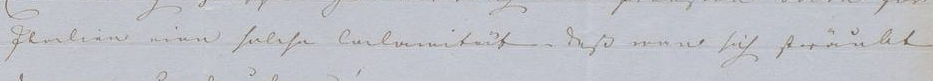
Italien eine solche Calamität – daß man sich sträubt
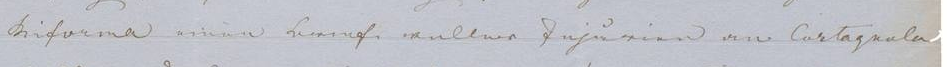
Riforma einen Brief – voller Injurien an Castagnola
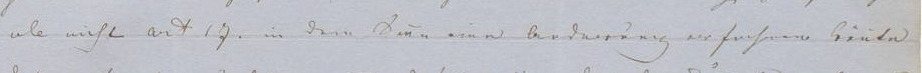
ob nicht art 17. in dem Sinne eine Änderung erfahren könnte
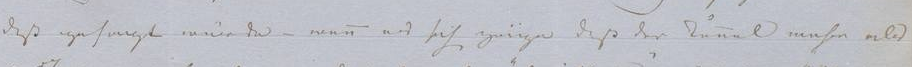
daß gesagt würde – wenn es sich zeige daß der Tunnel mehr als
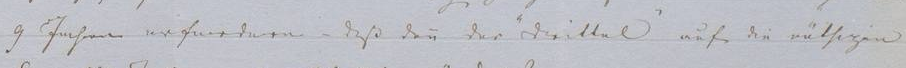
9 Jahre erfordere – daß dann das «Drittel» auf die nöthigen
